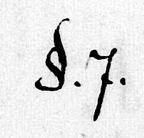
§. 7.
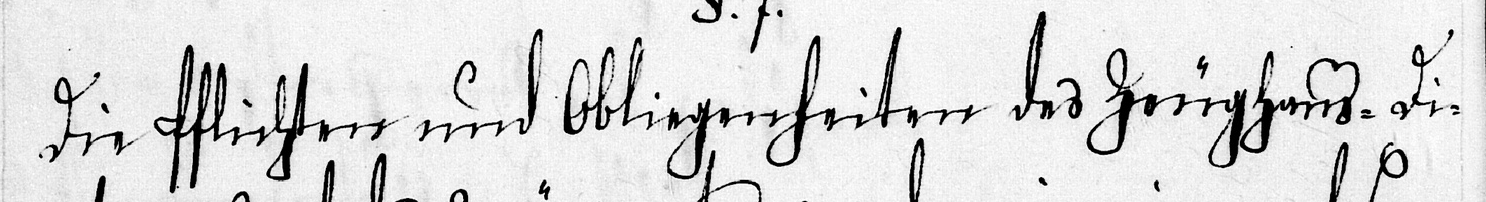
Die Pflichten und Obliegenheiten des Zeughaus-Di¬
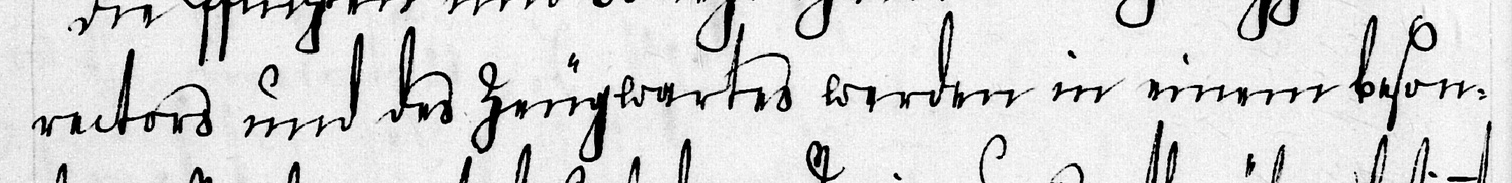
rectors und des Zeugwartes werden in einem beson¬
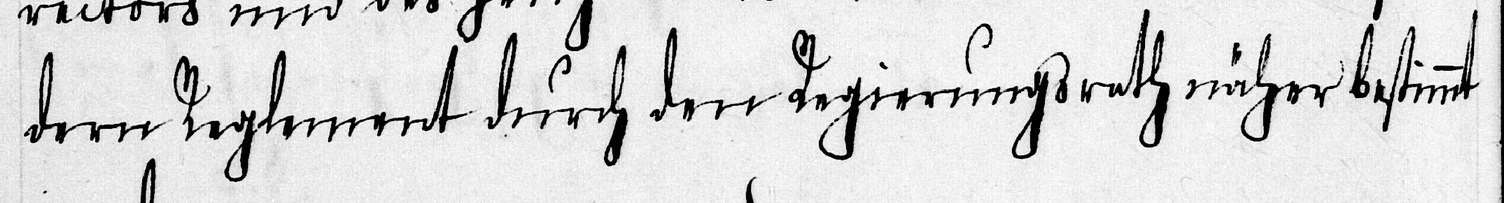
dern Reglement durch den Regierungsrath näher bestim¬
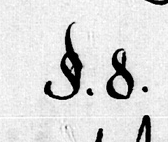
§. 8.
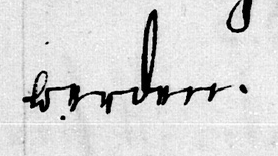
werden.
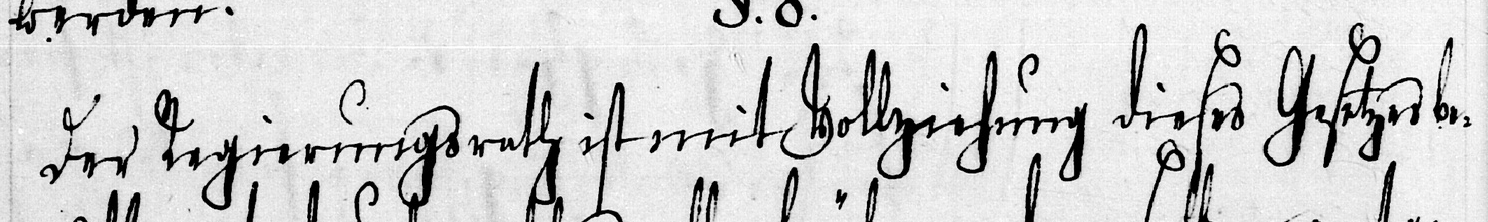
Der Regierungsrath ist mit Vollziehung dieses Gesetzes
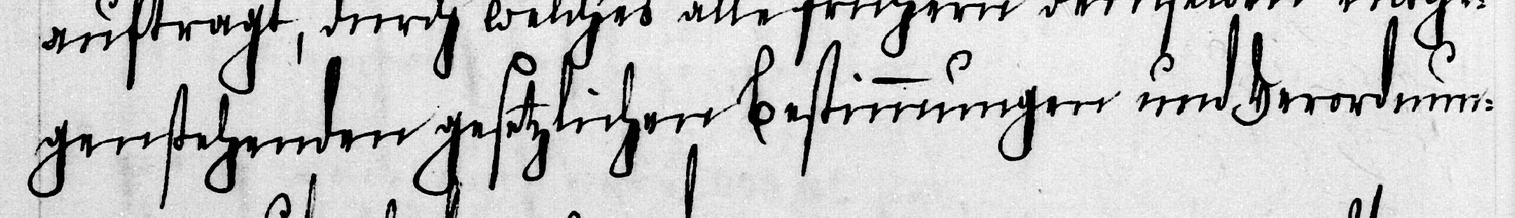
genstehenden gesetzlichen Bestimmungen und Verordnun¬
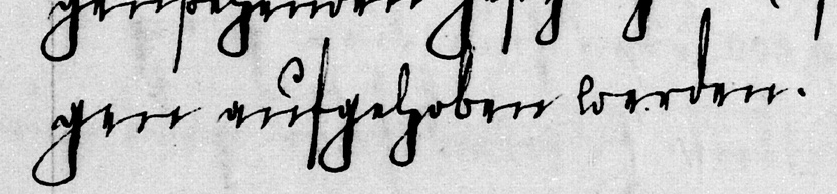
gen aufgehoben werden.
